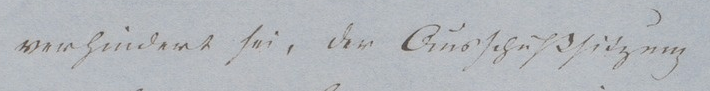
verhindert sei, der Ausschusssitzung
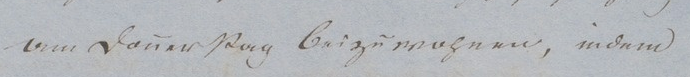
von Donnerstag beizuwohnen, indem
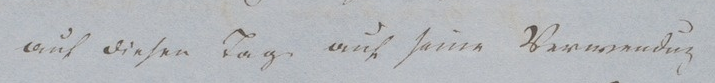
auf diesen Tag auf seine Verwendung
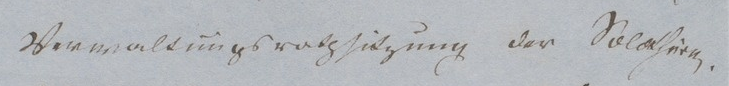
Verwaltungsrathsitzung der Solothurn.
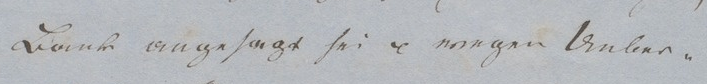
Bank angesagt sei & wegen Ueber-
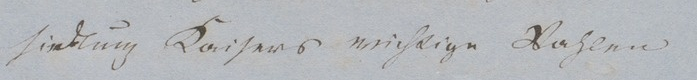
siedlung Kaisers wichtige Wahlen
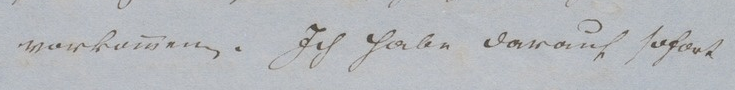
vorkommen. Ich habe darauf sofort
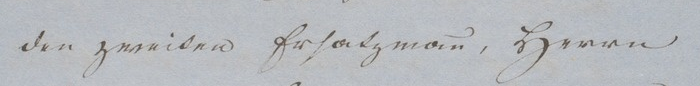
den zweiten Ersatzmann, Herrn
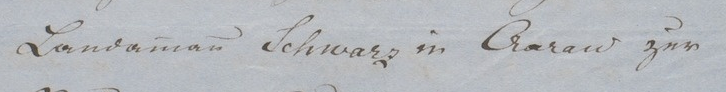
Landammann Schwarz in Aarau zur
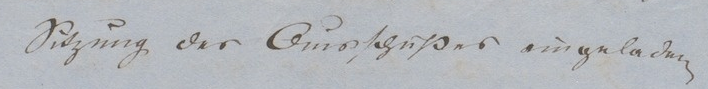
Sitzung des Ausschußes eingeladen.
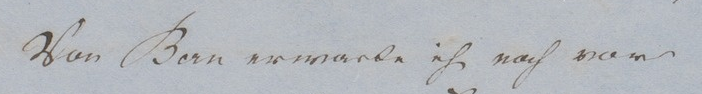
Von Bern erwarte ich noch vor
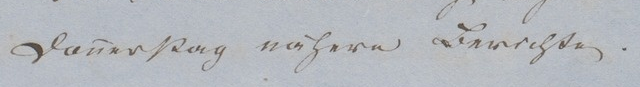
Donnerstag nähere Berichte.
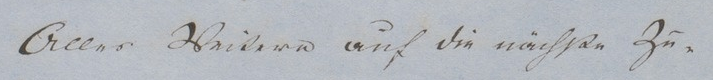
Alles Weitere auf die nächste Zu-
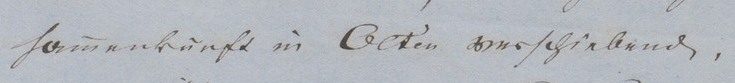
sammenkunft in Olten, verschiebend,
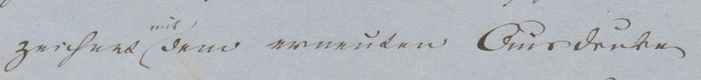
zeichne mit dem erneuten Ausdruke
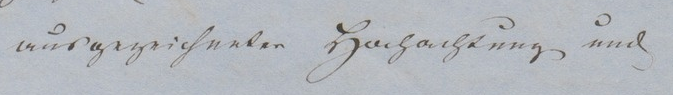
ausgezeichneter Hochachtung und
